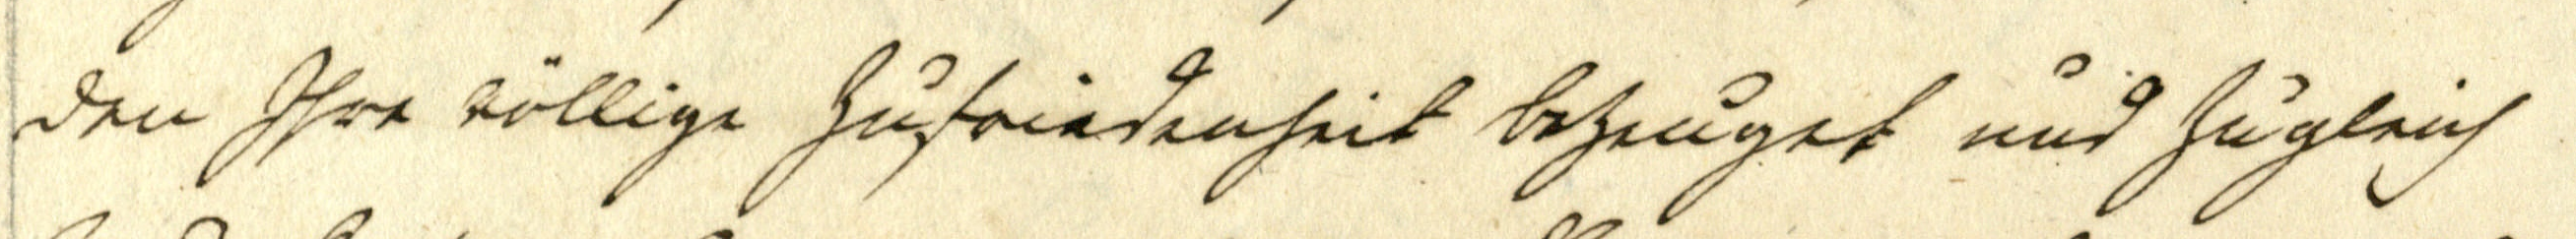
den Ihre völlige Zufriedenheit bezeuget und zugleich
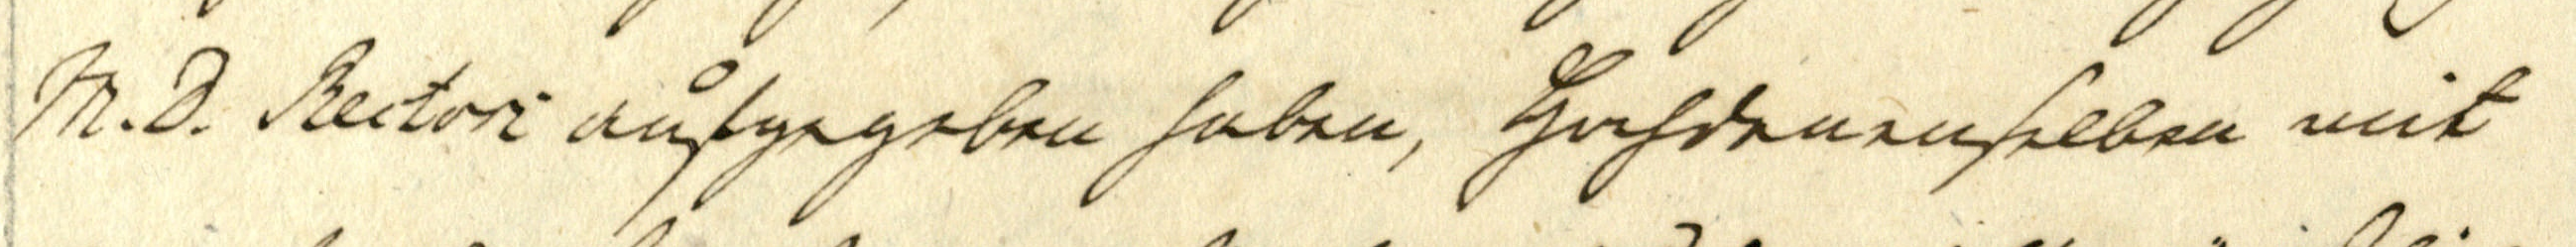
M. D. Rector aufgegeben haben, Hochdenenselben mit
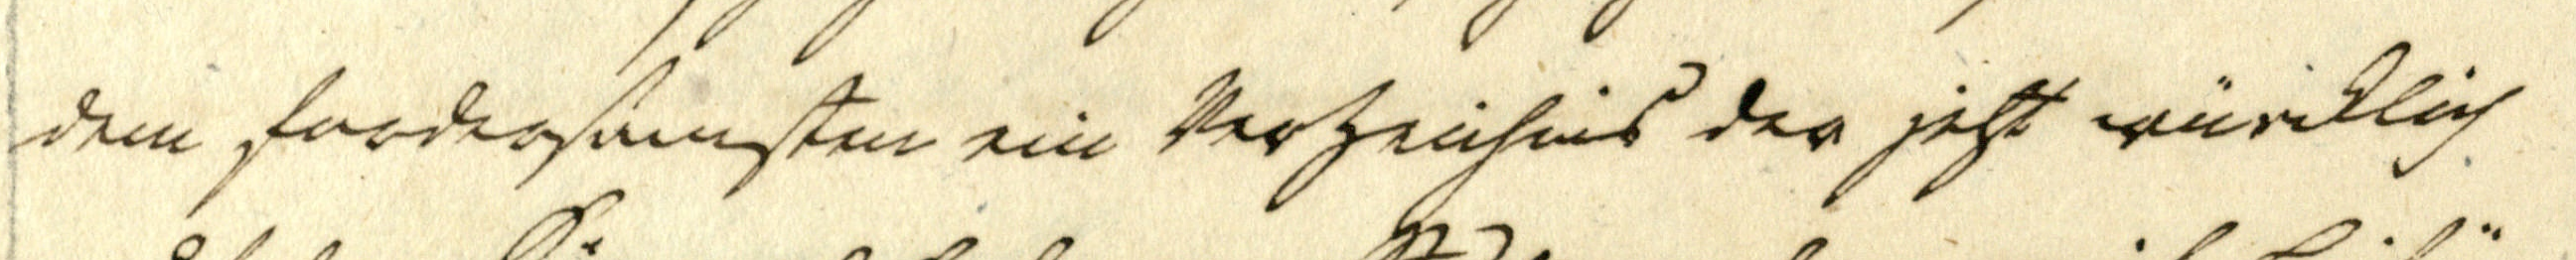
dem fordersamsten ein Verzeichnis der jetzt würcklich
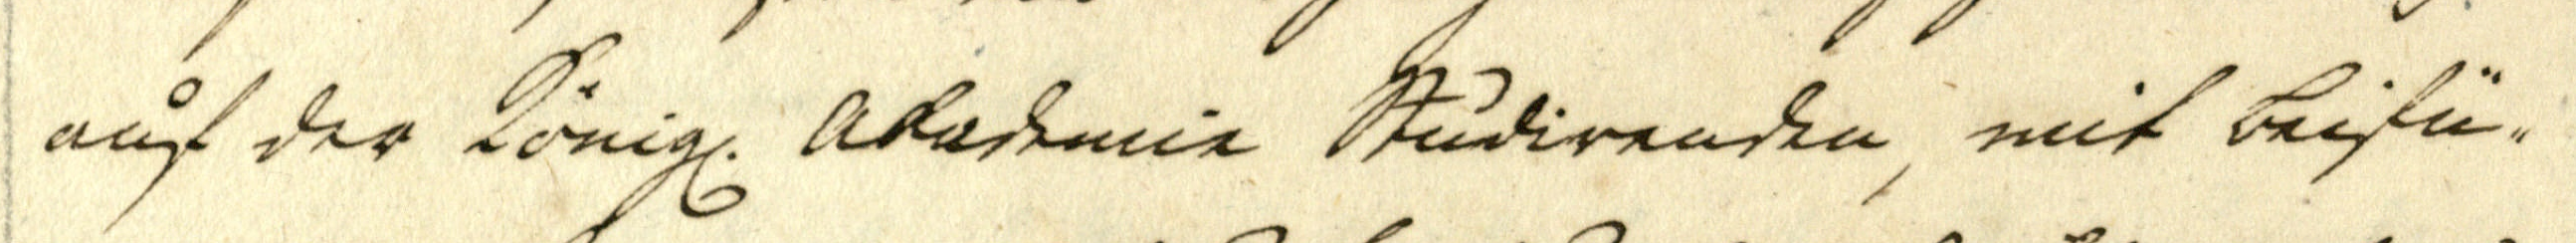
auf der Königl. Akademie Studirenden, mit Beifü¬
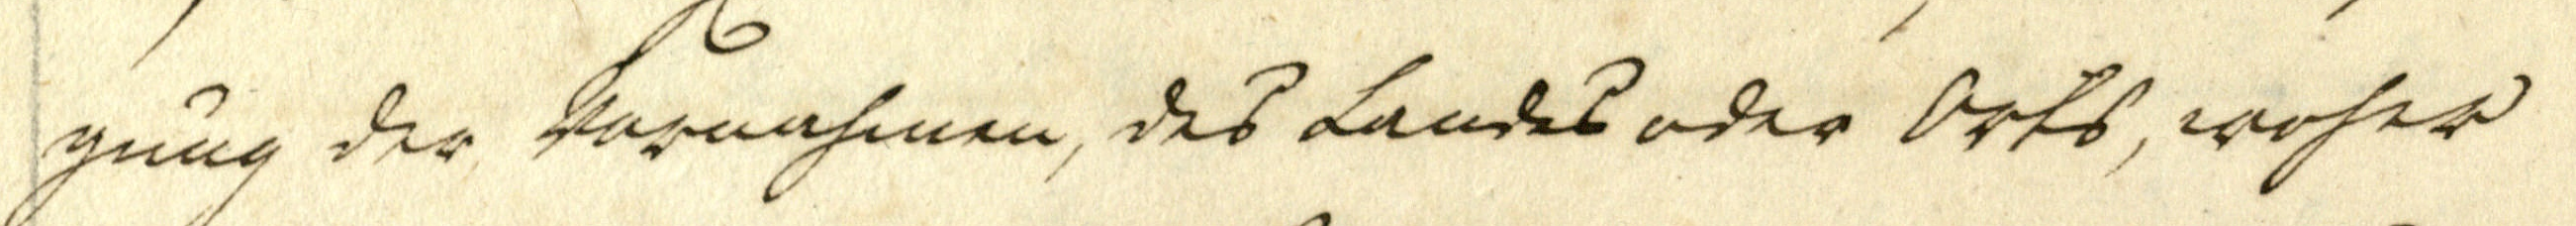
gung der Vornahmen, des Landes oder Orts, woher
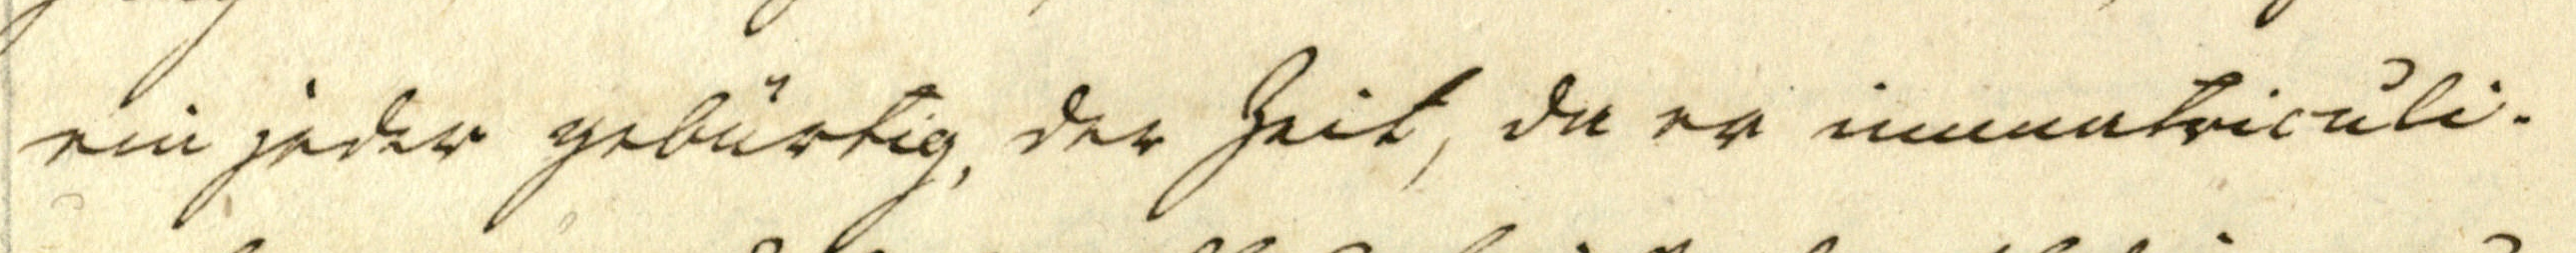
ein jeder gebürtig, der Zeit, da er immatriculi¬
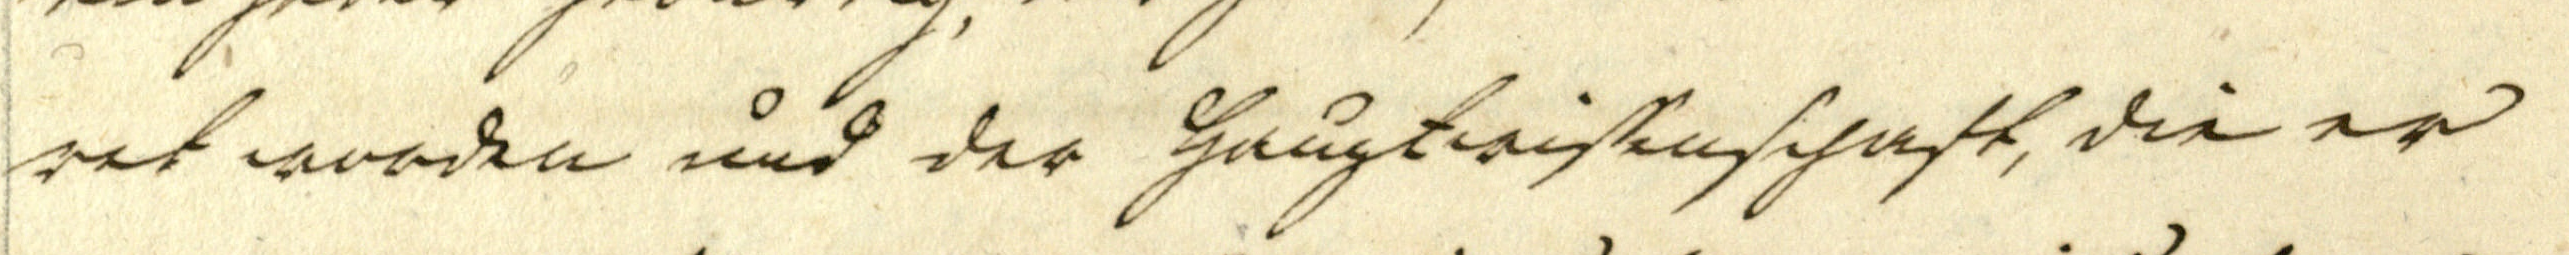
ret worden und der Hauptwissenschaft, die er
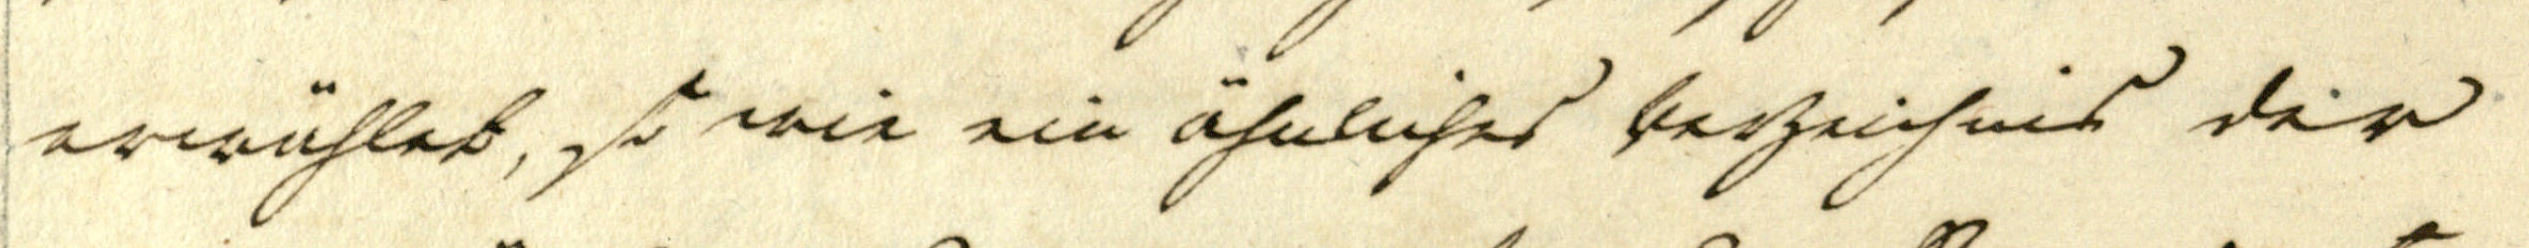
erwählet, so wie ein ähnliches Verzeichnis der
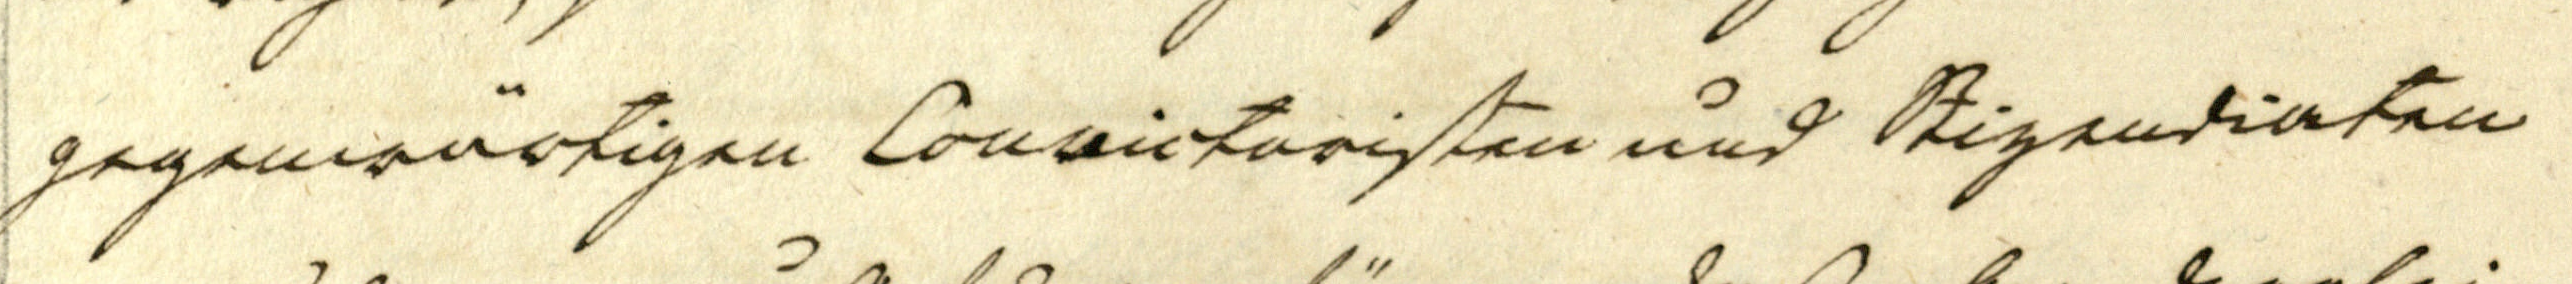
gegenwärtigen Convictoristen und Stipendiaten
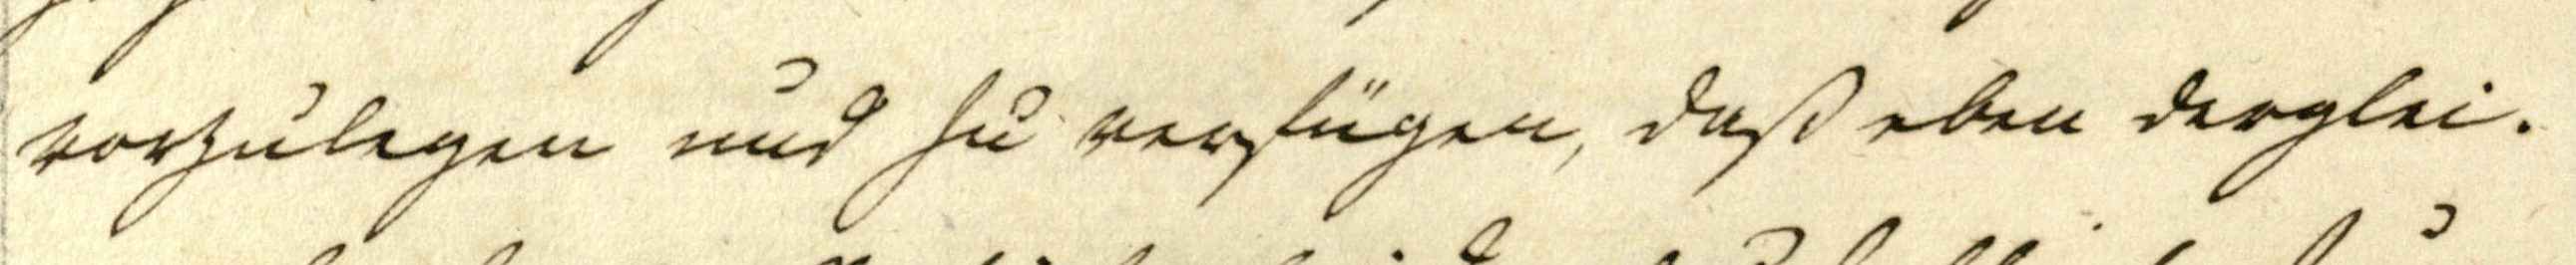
vorzulegen und zu verfügen, daß eben derglei¬
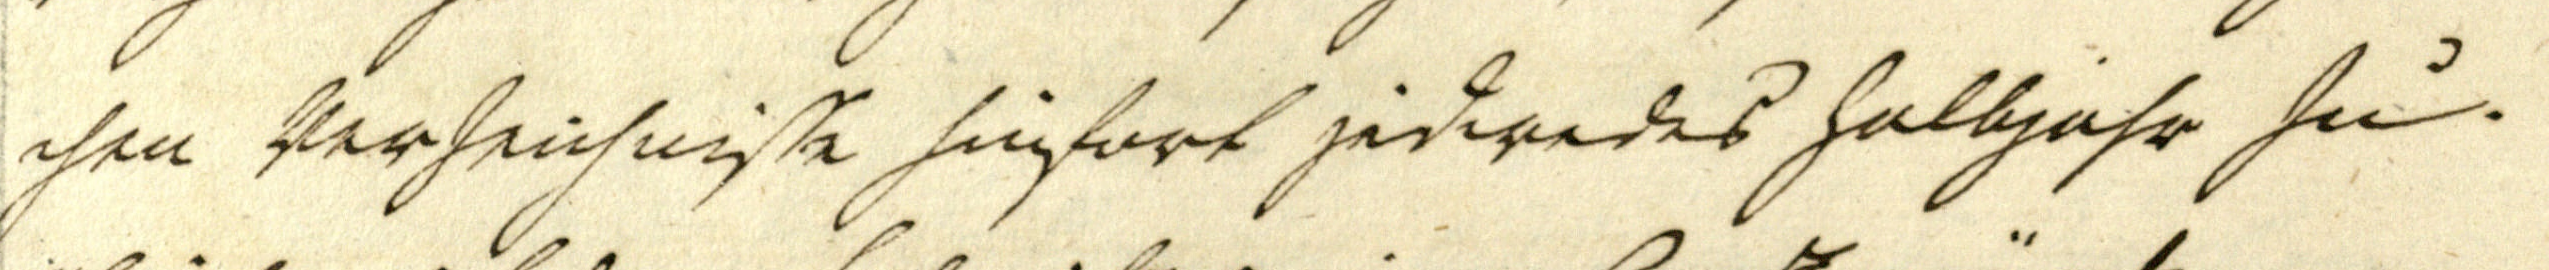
chen Verzeichnisse hinfort jedwedes Halbjahr zu¬
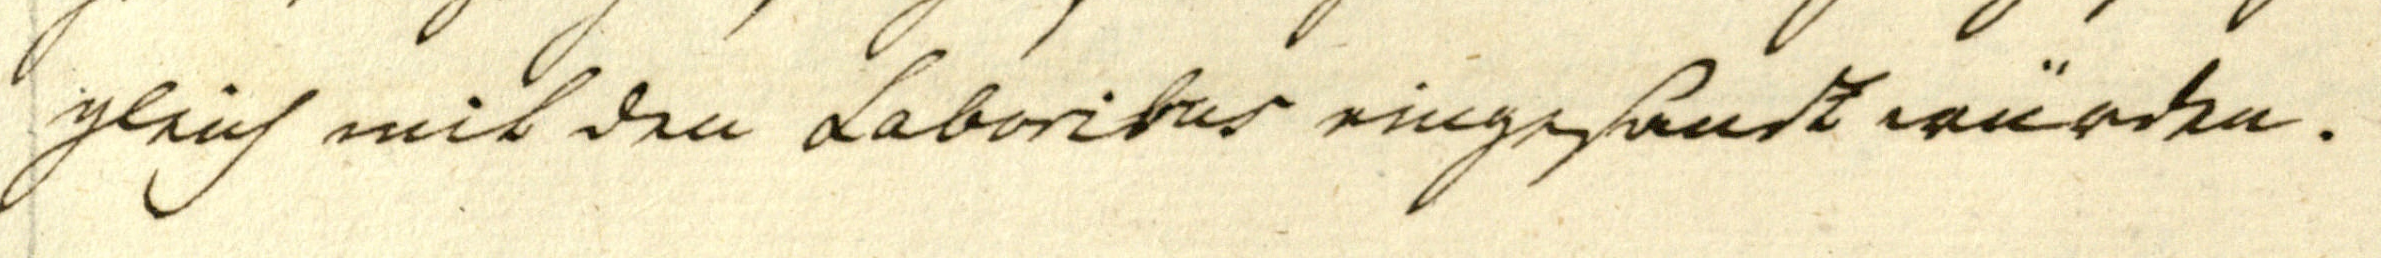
gleich mit den Laboribus eingesandt würden.
